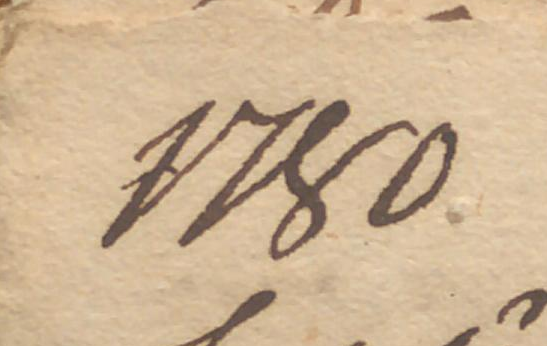1780
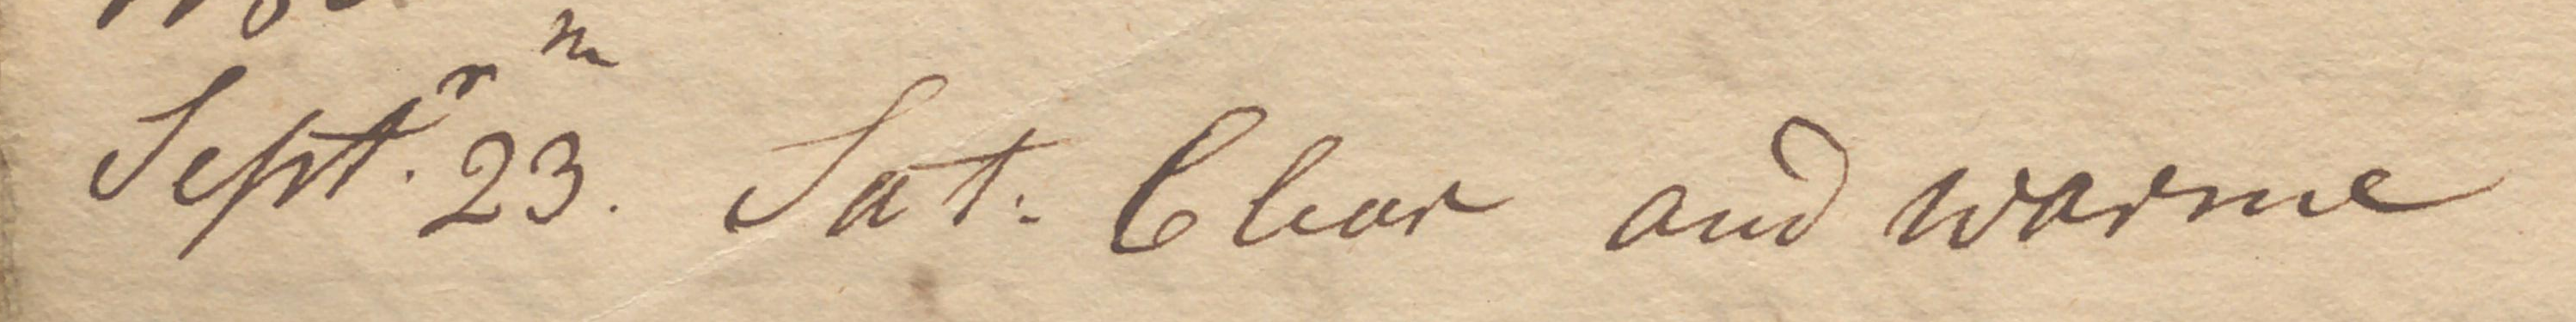Sept^r. 23^th. Sat. Clear and warme
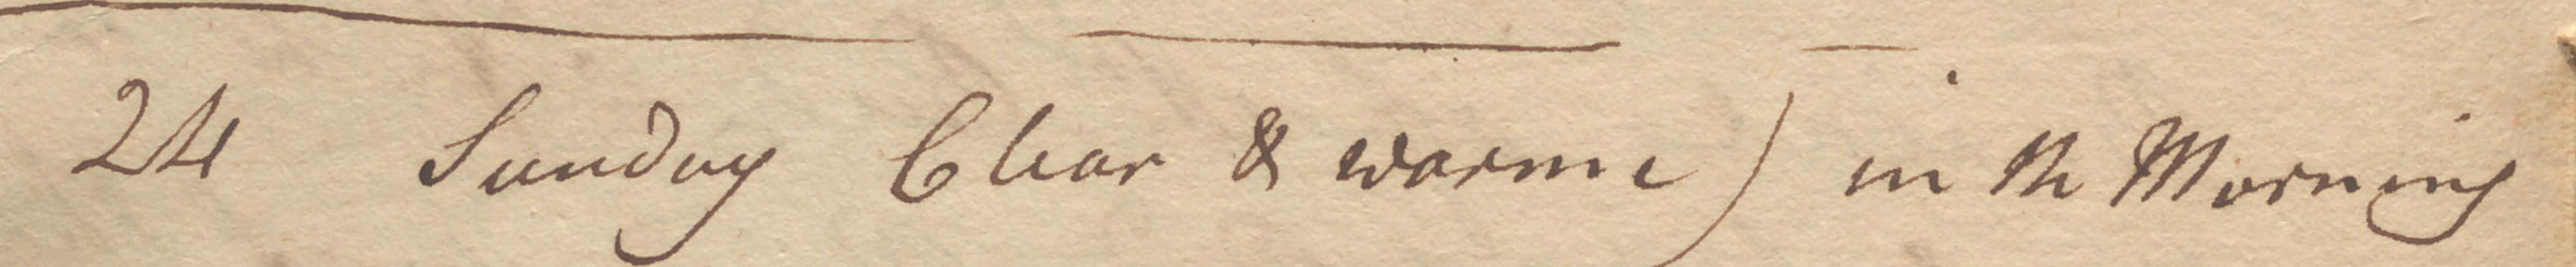24 Sunday Clear & warme) in th Morning
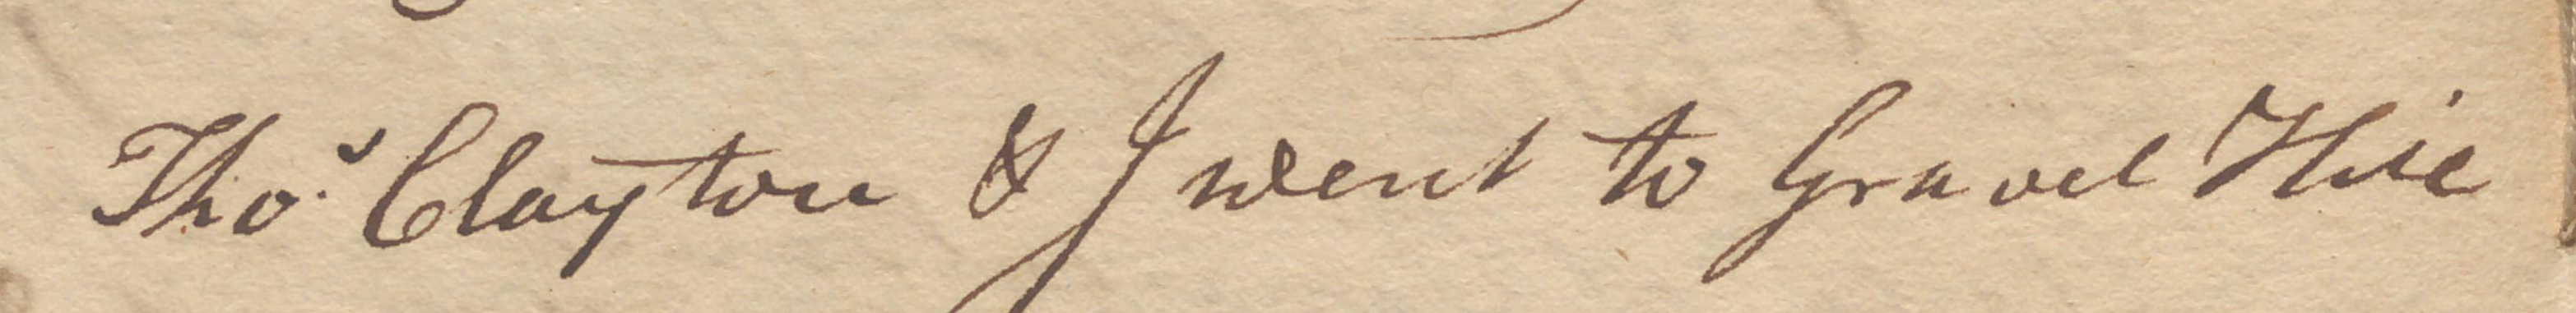Tho^s. Clayton & I went to Gravel Hill
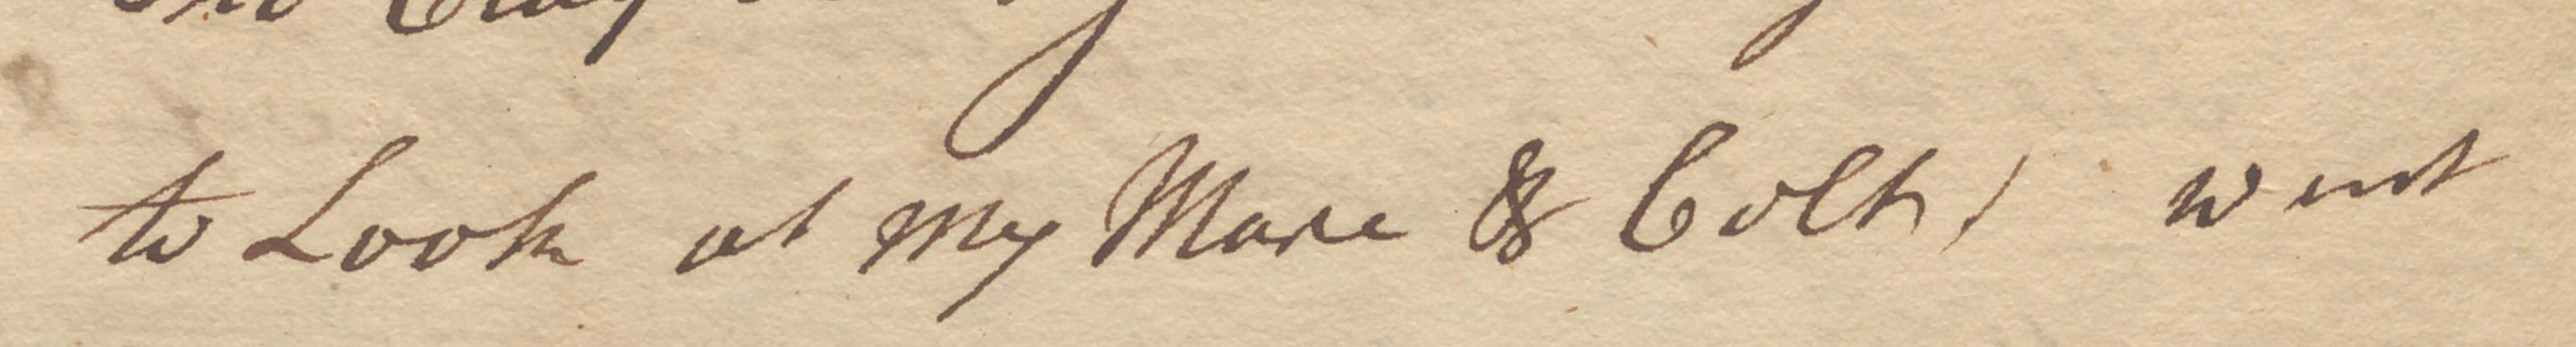to Look at My Mare & Colt, went
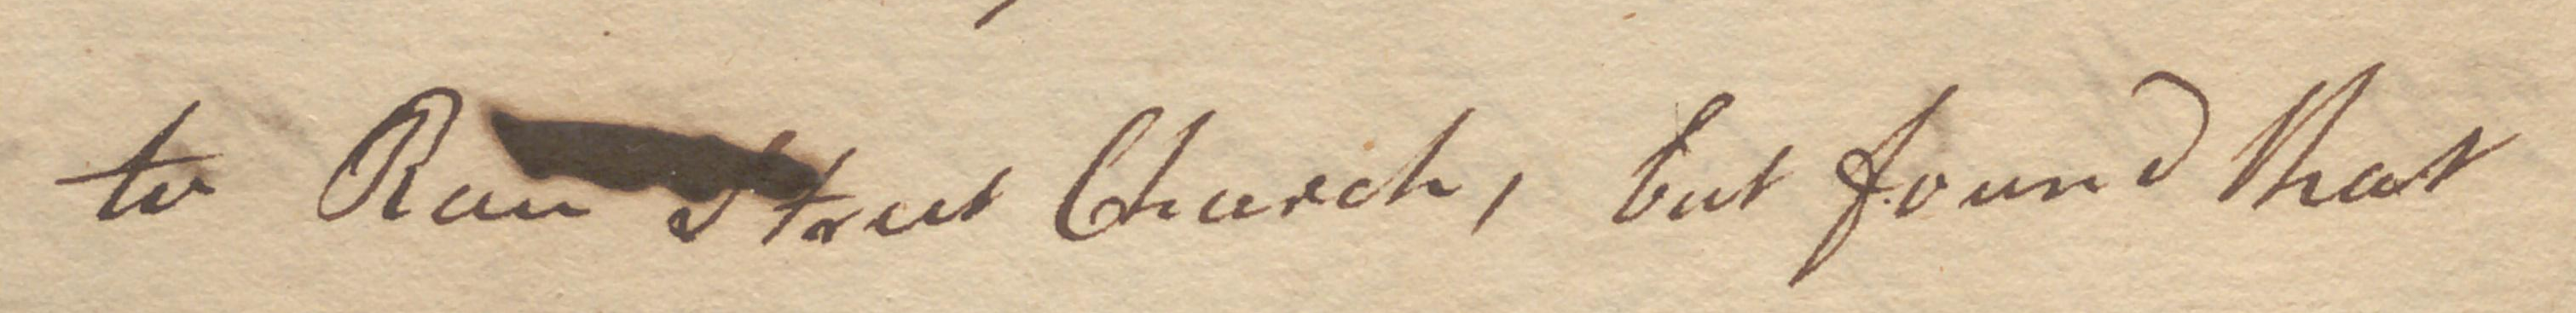to Race Street Church, but found that
